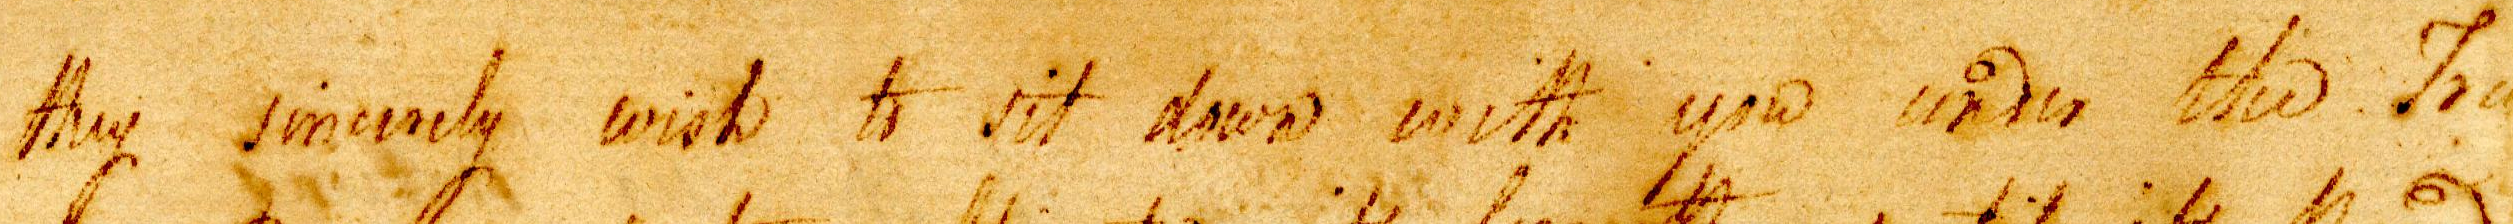they sincerely wish to sit down with you under the Tree
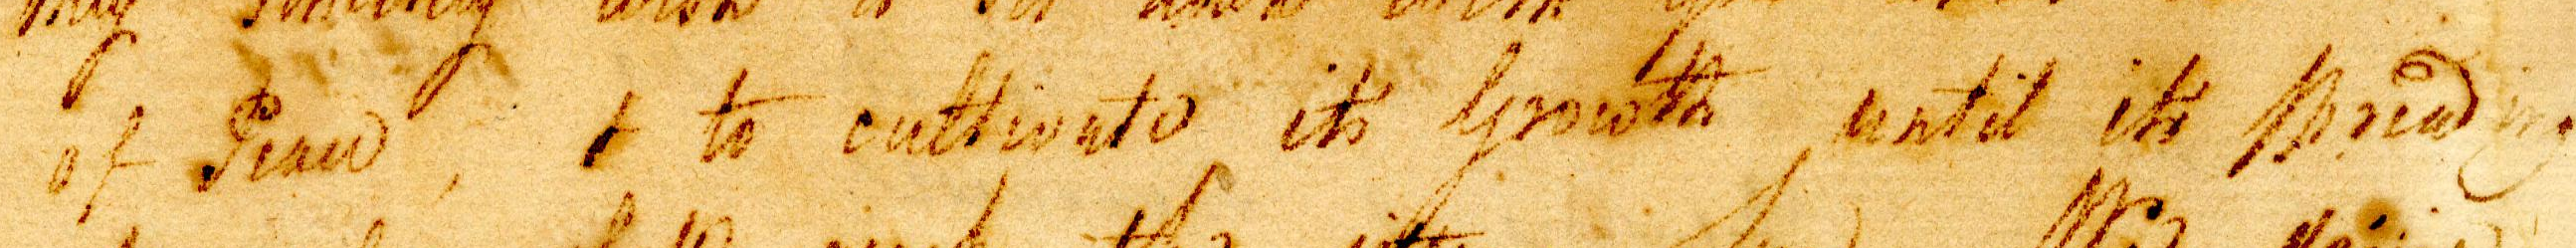of Peace, & to cultivate its Growth, until its spreading
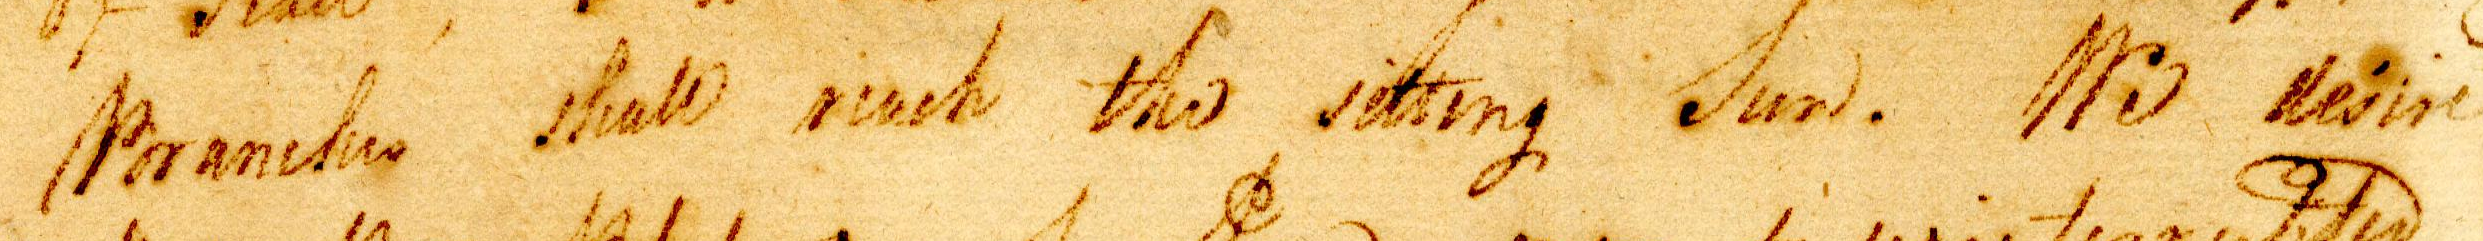Branches shall reach the setting Sun. We desire
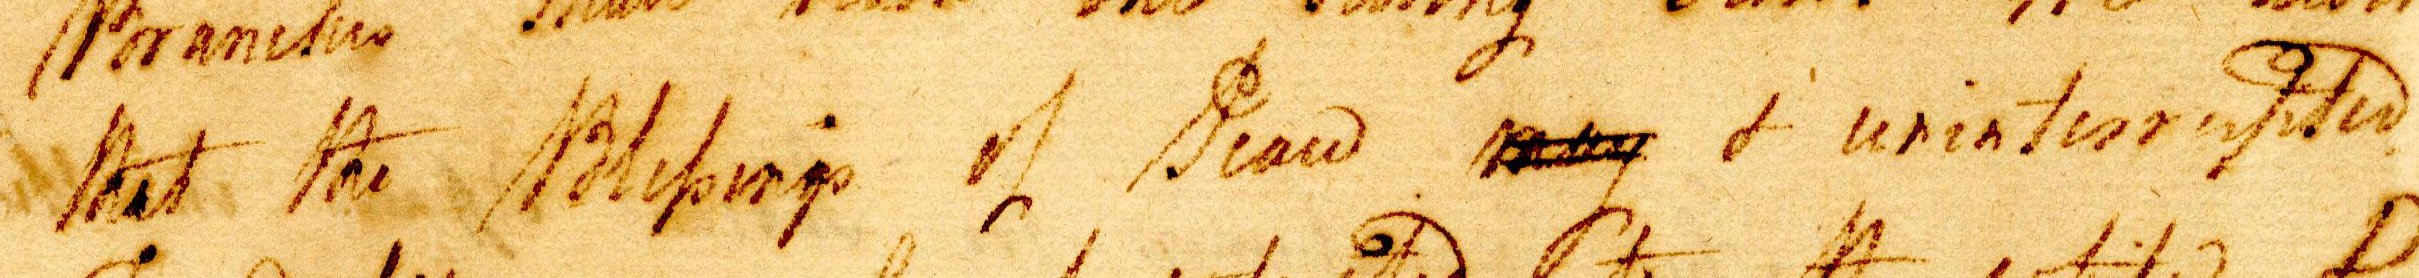that the Blessings of Peace may & uninterrupted
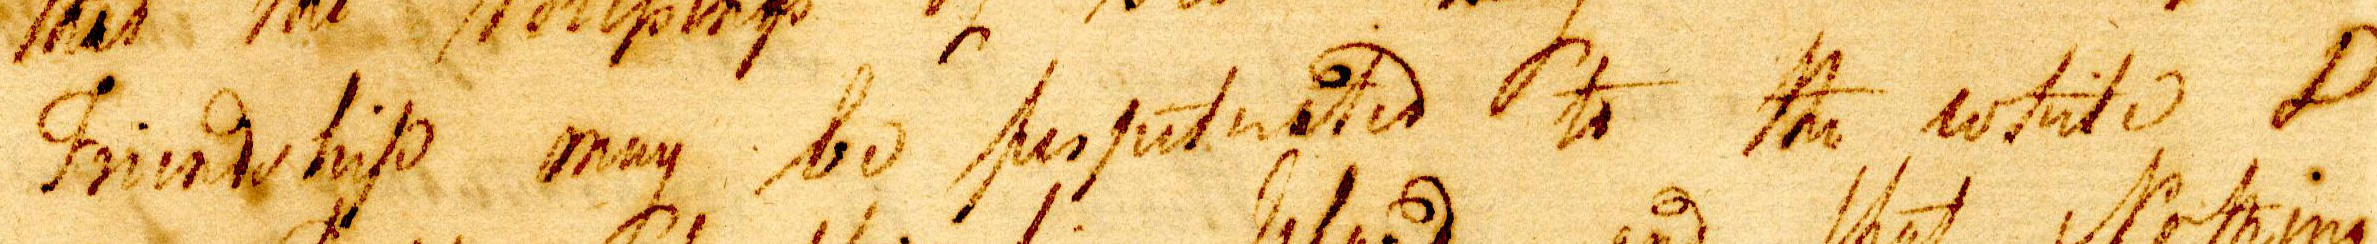Friendship may be perpetuated to the white &
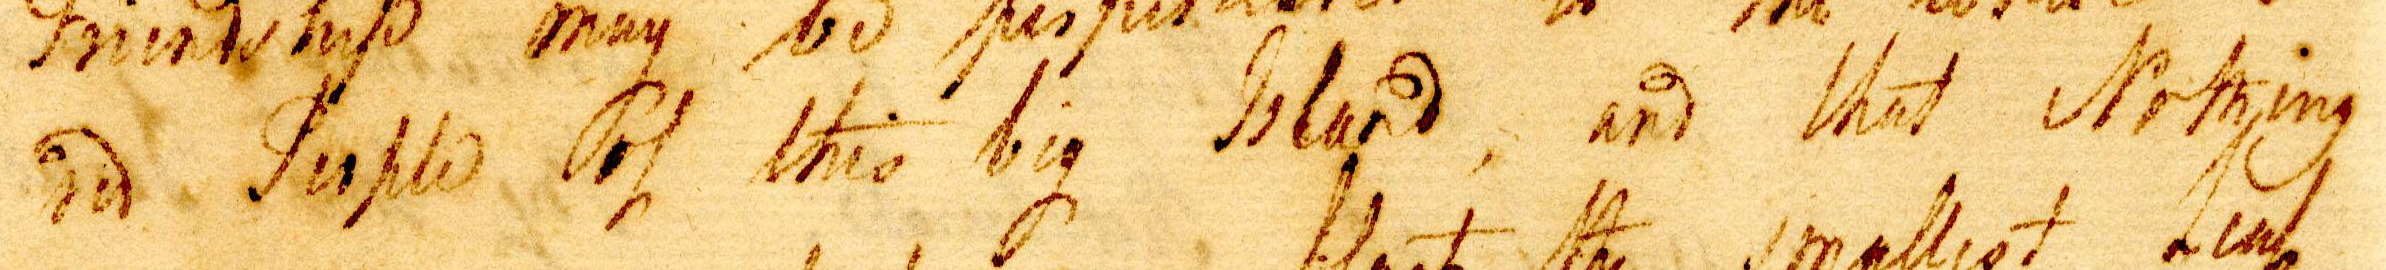red People of this big Island, and that Nothing
